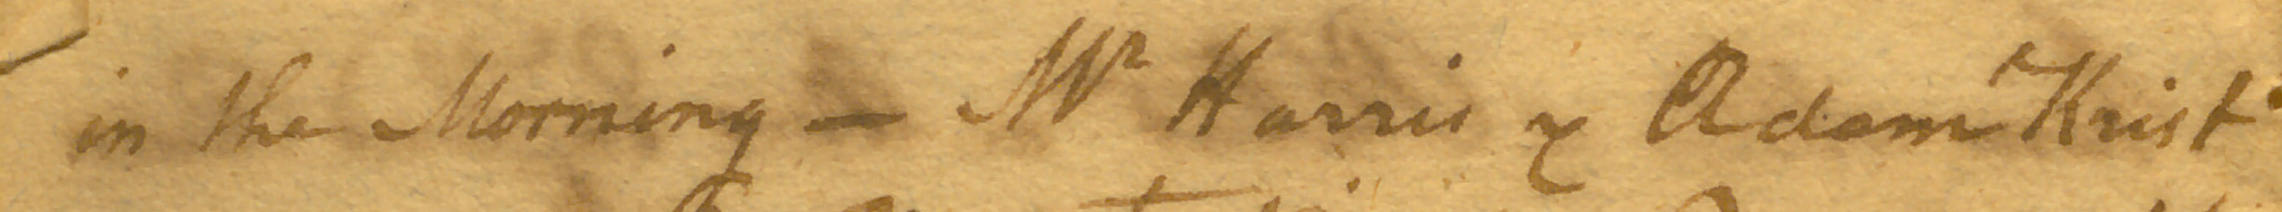in the Morning- M^r Harris & Adam Krist
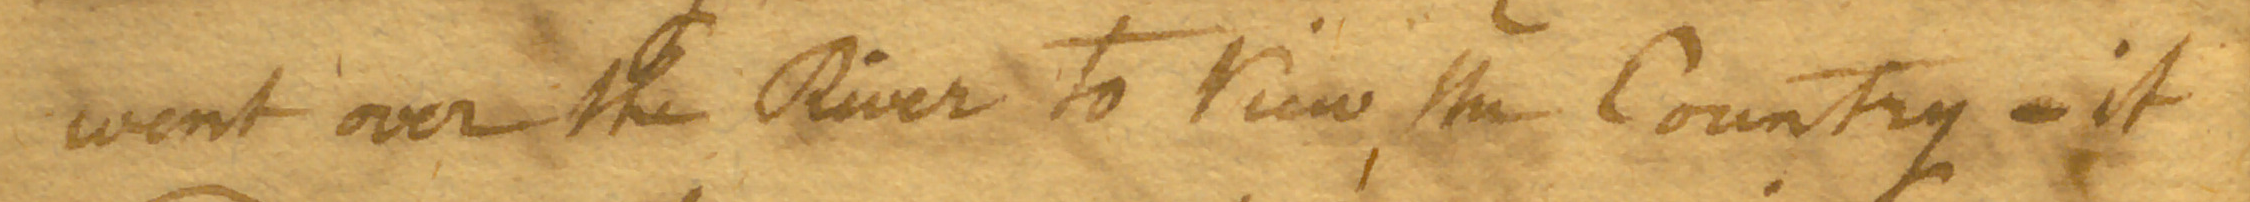went over the River to View the Country- it
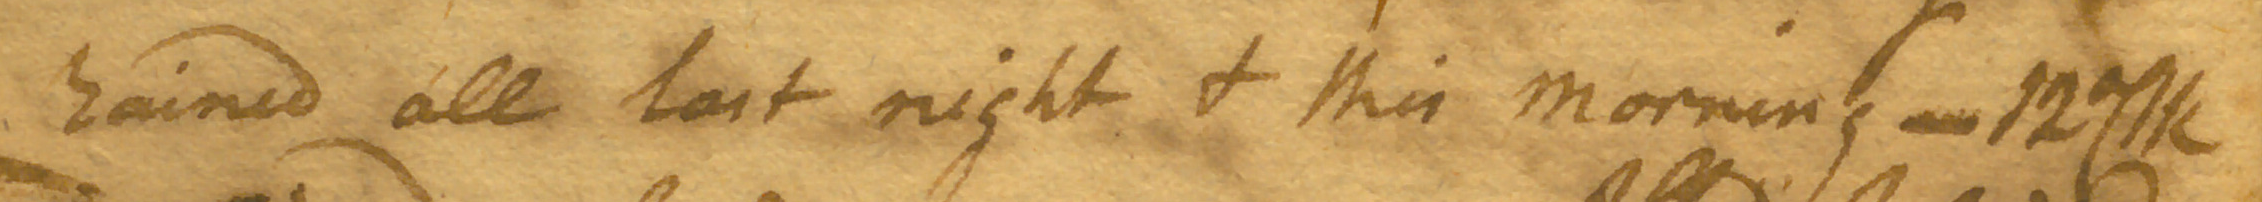rained all last night & this morning- 12 ^oClk
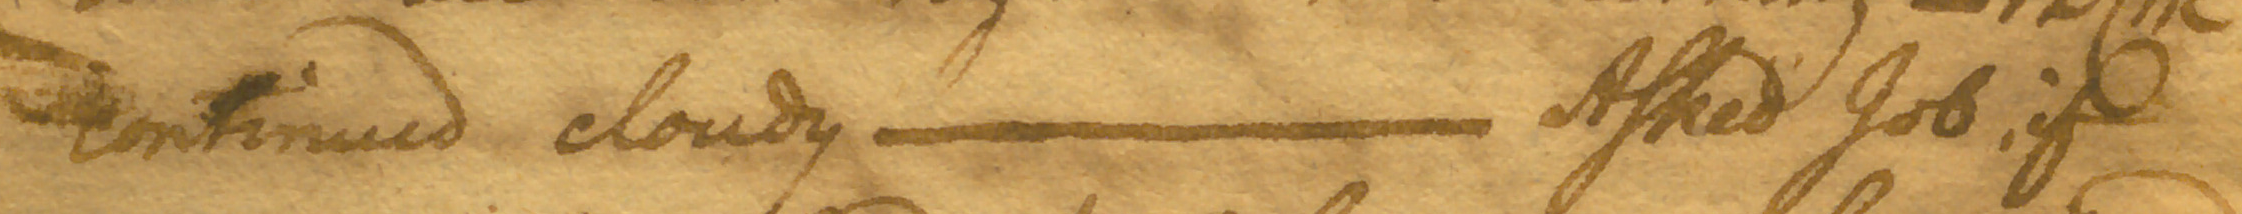countinued cloudy- Asked Job if
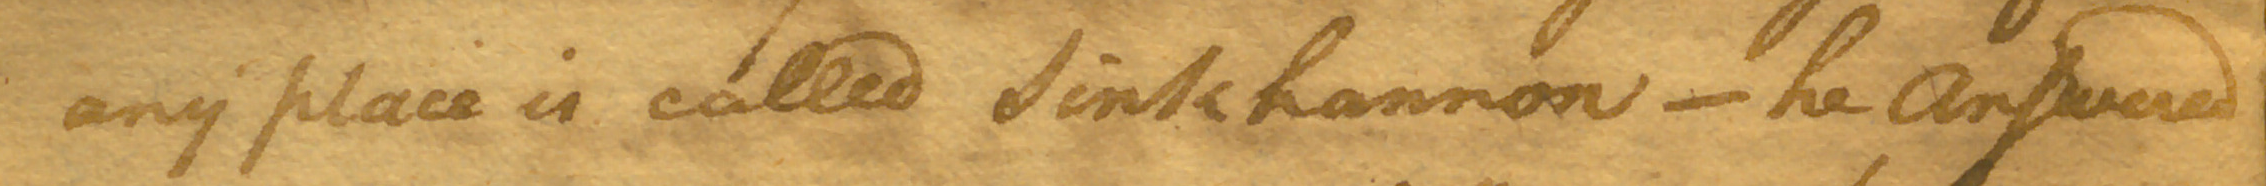any place is called Sinkhannon- he answered
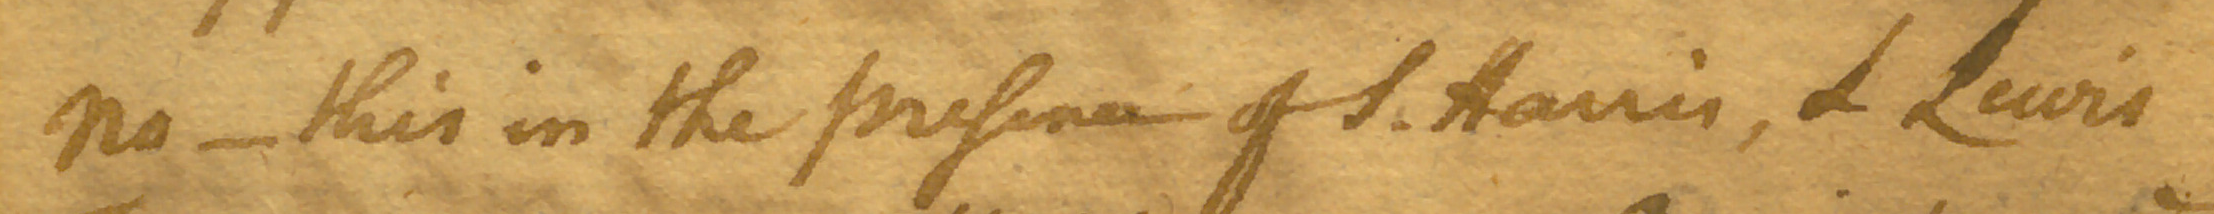no- this is the presence of S. Harris, L Lewis
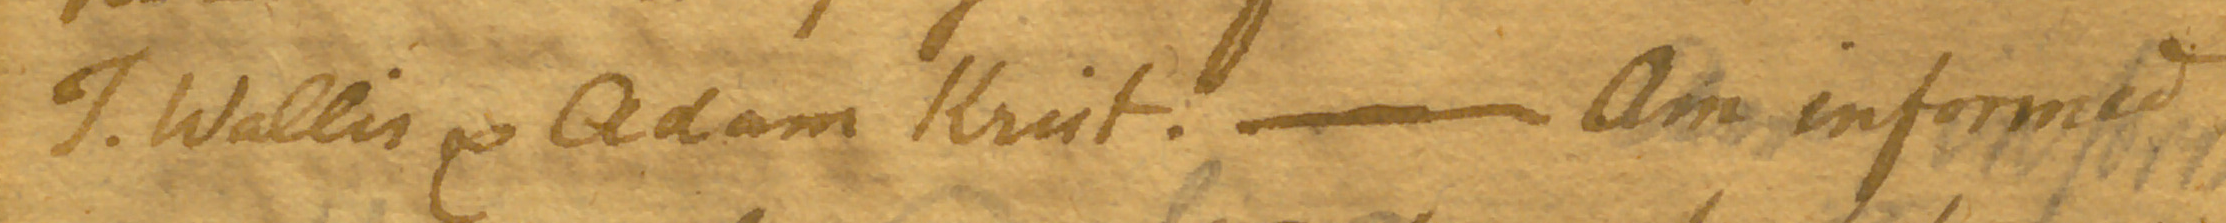T. Wallis & Adam Krist.- Am informed
